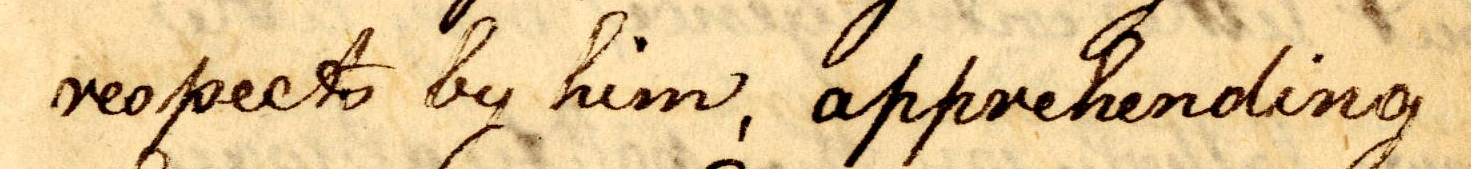respects by him, apprehending
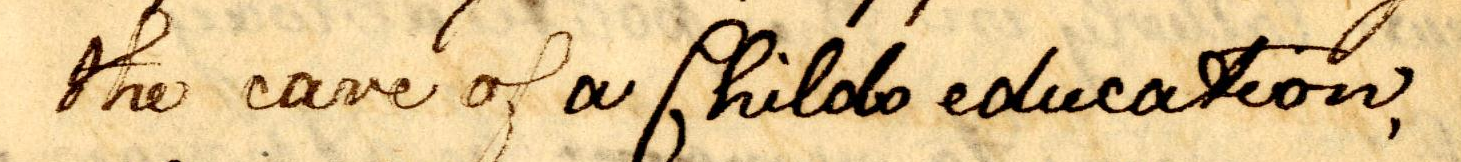the care of a Childs education,
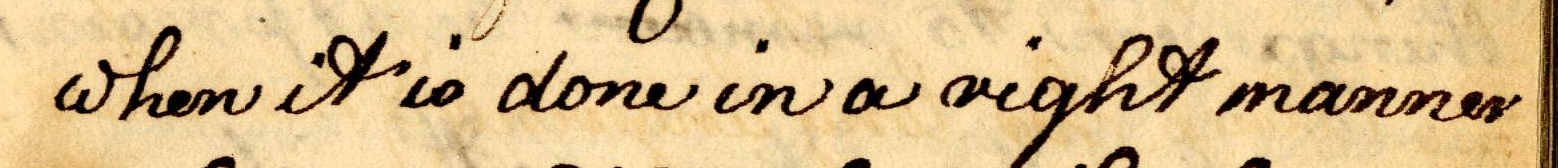when it is done in a right manner
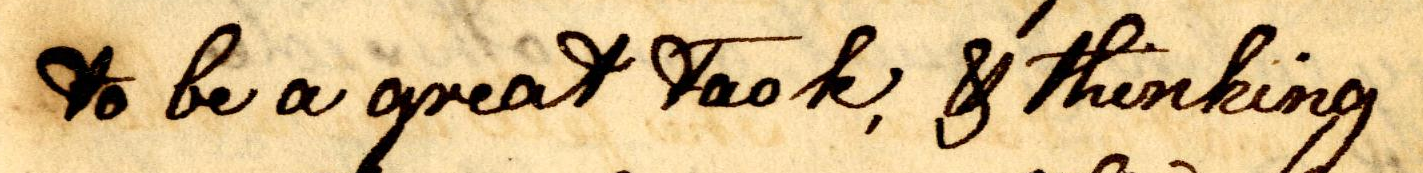to be a great task, & thinking
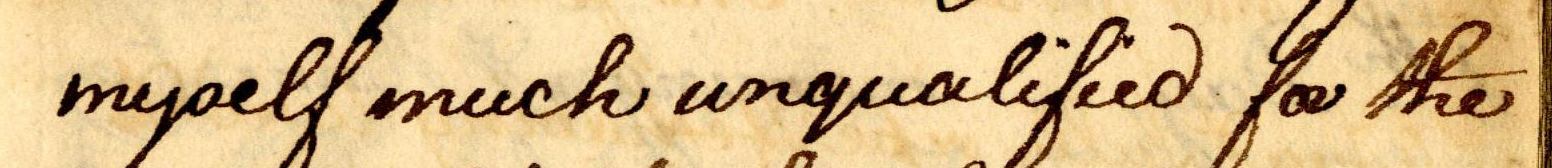myself much unqualified for the
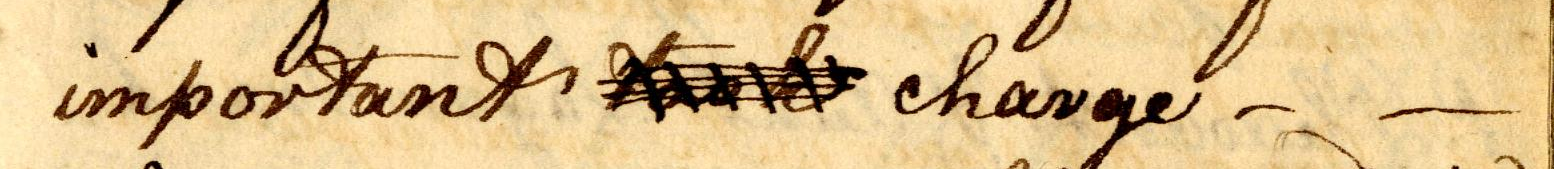important [____] charge--
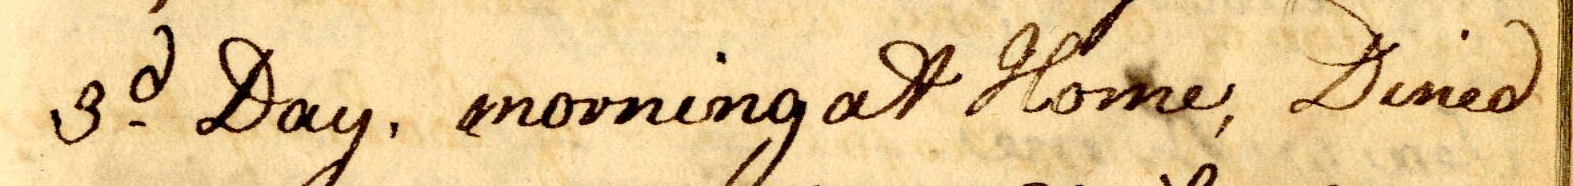3^d. Day. morning at Home, Dined
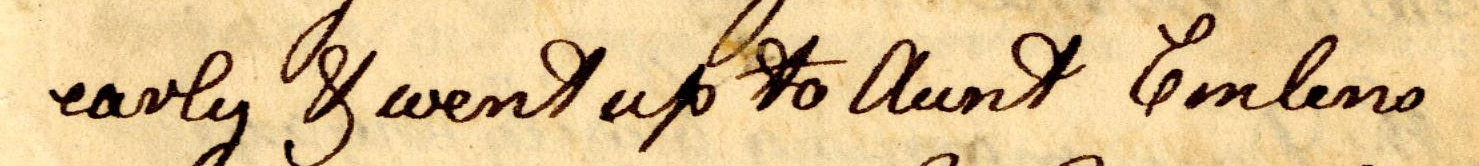early & went up to Aunt Emlens
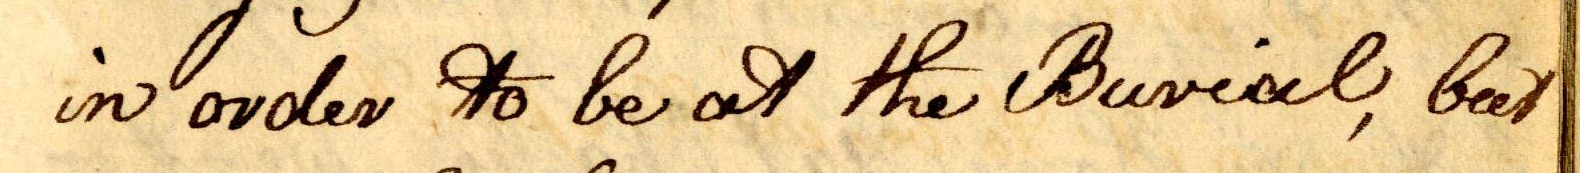in order to be at the Burial, but
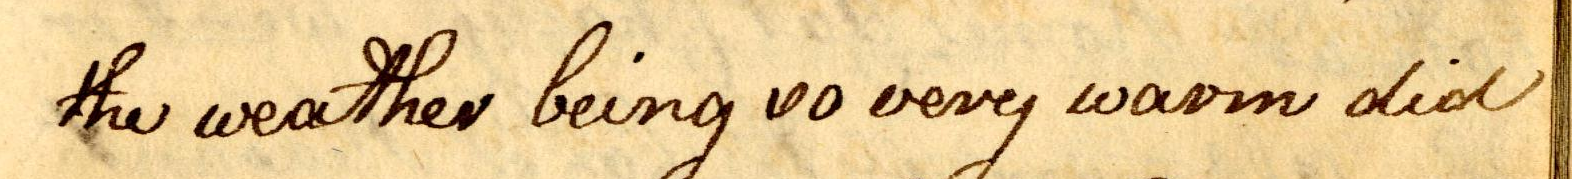the weather being so very warm did
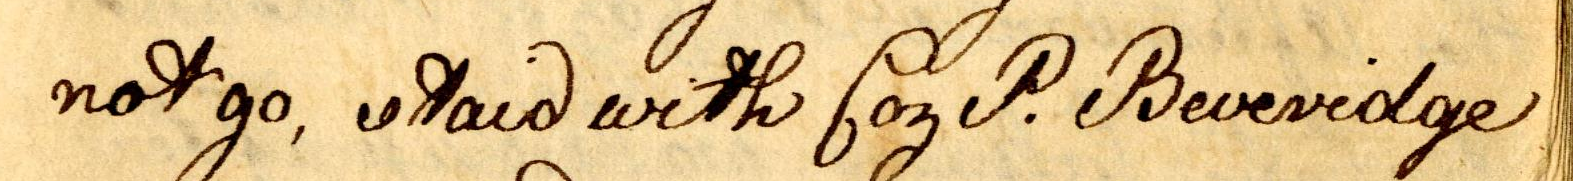not go, staid with Coz P. Beveridge
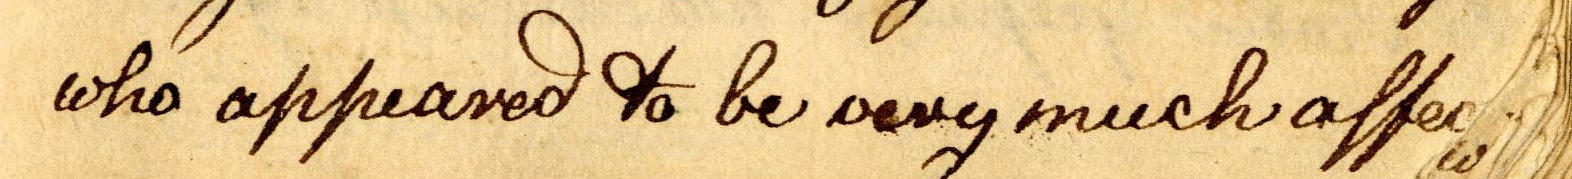who appeared to be very much affec
